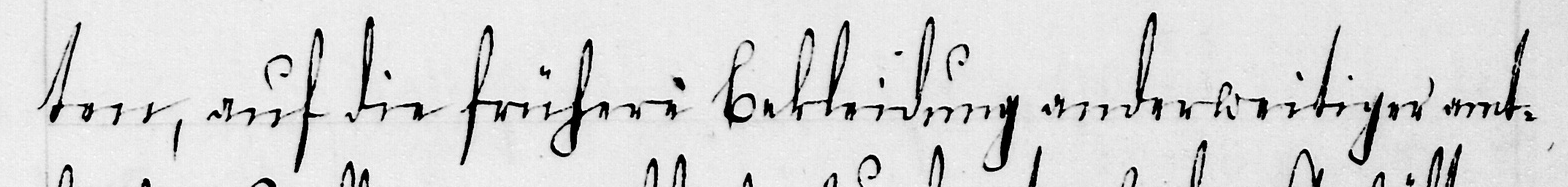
ten, auf die frühere Bekleidung anderweitiger amt¬
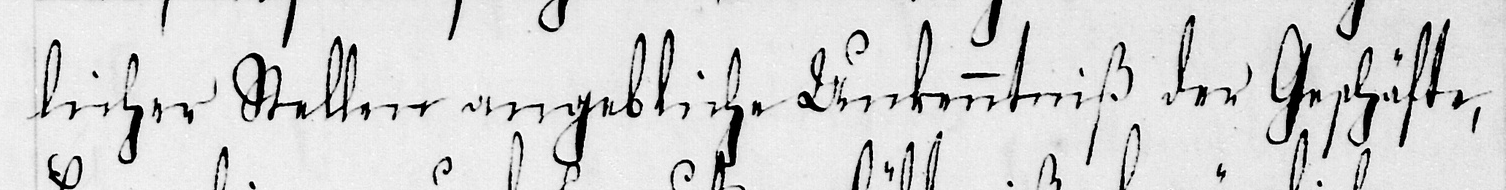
licher Stellen angebliche Unkenntniß der Geschäfte,
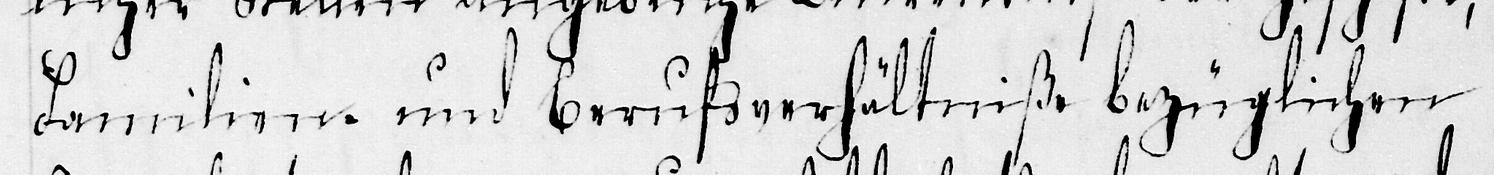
Familien- und Berufsverhältniße bezüglichen
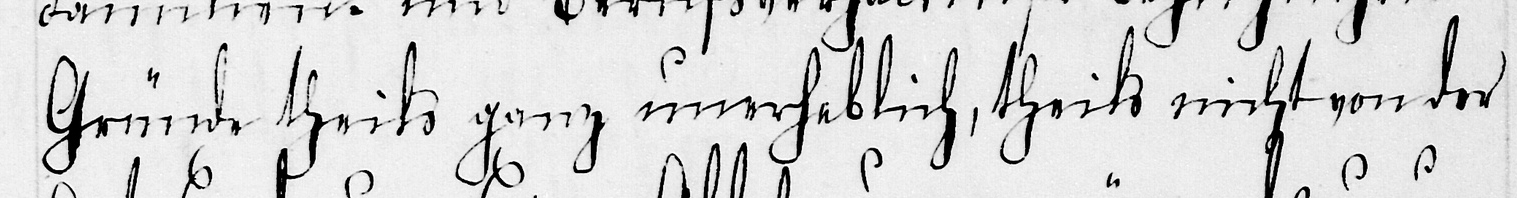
Gründe theils ganz unerheblich, theils nicht von der
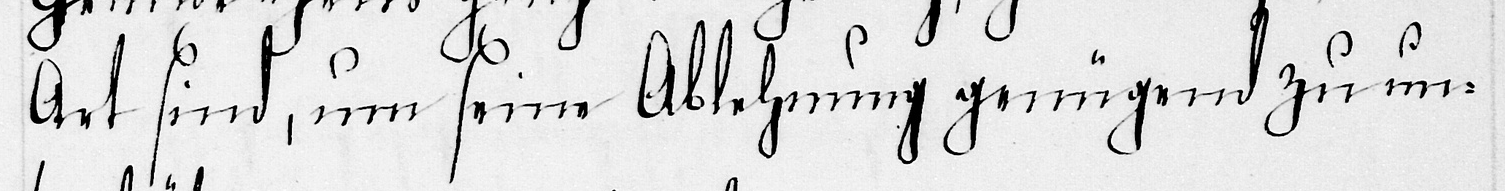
Art sind, um seine Ablehnung genügend zu un¬
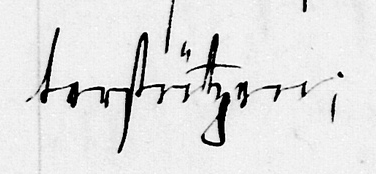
terstützen;
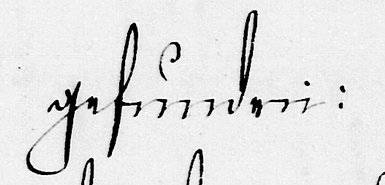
gefunden:
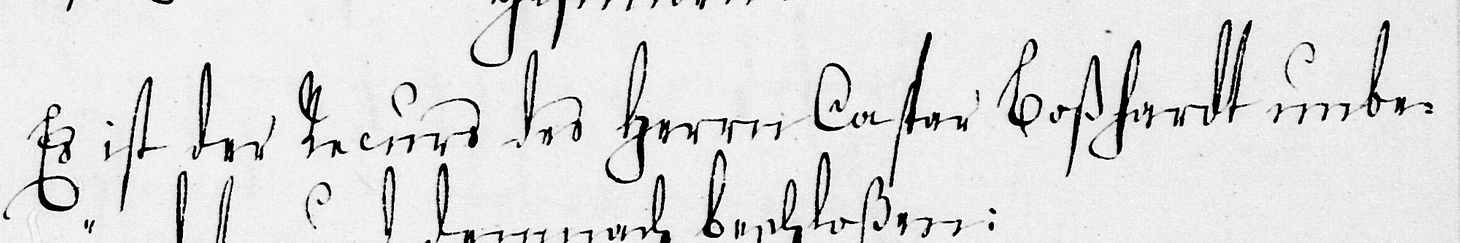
Es ist der Recurs des Herrn Caspar Boßhardt unbe¬
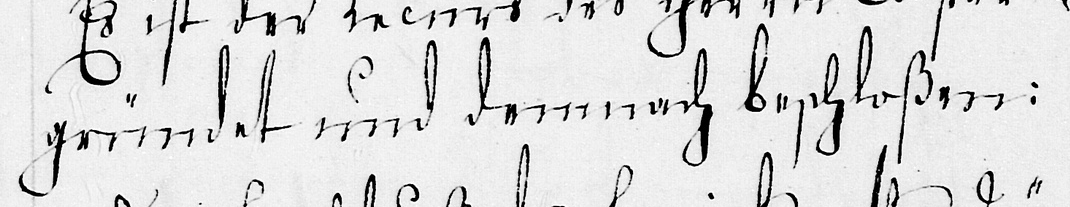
gründet und demnach beschloßen:
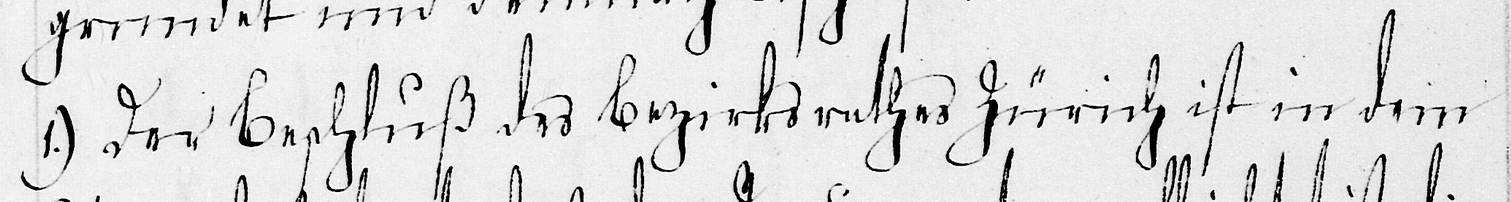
1.) Der Beschluß des Bezirksrathes Zürich ist in dem
